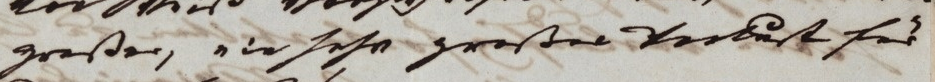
großer, ein sehr großer Verlust für
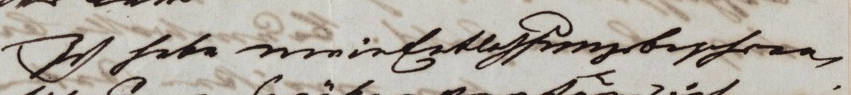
Ich habe mein Entlassungsbegehren,
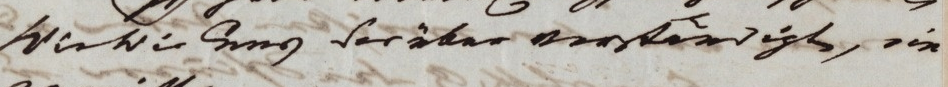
wie wir uns darüber verständigt, ein-
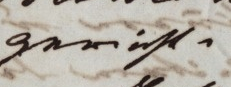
gereicht.
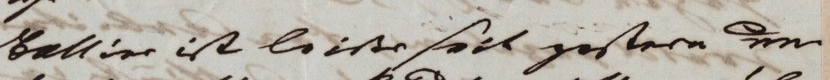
Bollier ist leider seit gestern un-
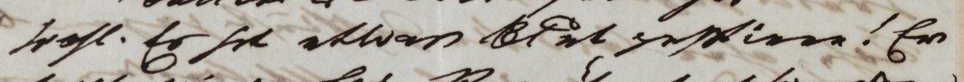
wohl. Er hat etwas Blut gespieen! Er
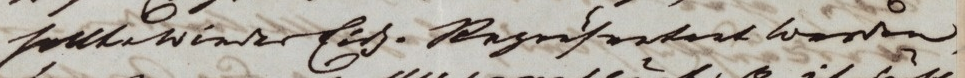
sollte wieder Eidg. Repräsentant werden,
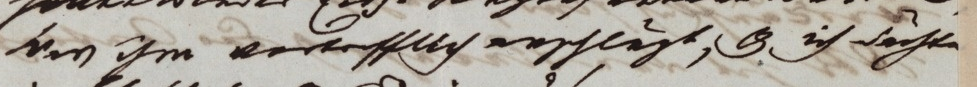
was ihm vortrefflich anschlägt, & ich dächte
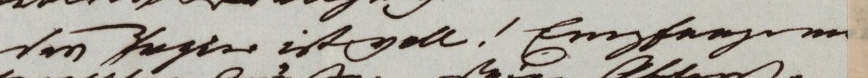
Das Papier ist voll! Empfange mei-
